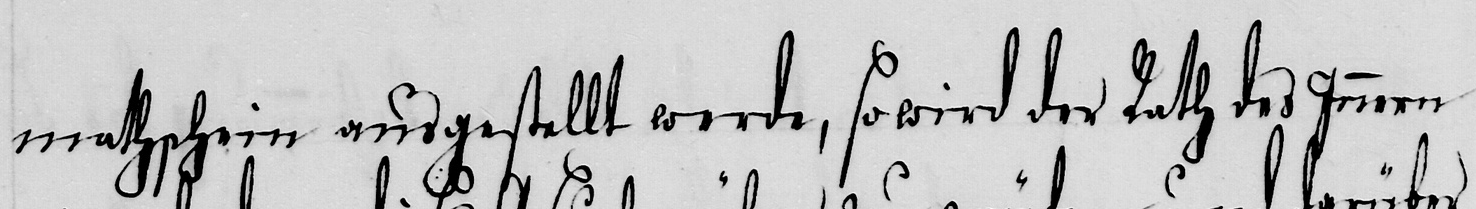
mathschein ausgestellt werde, so wird der Rath des Innern
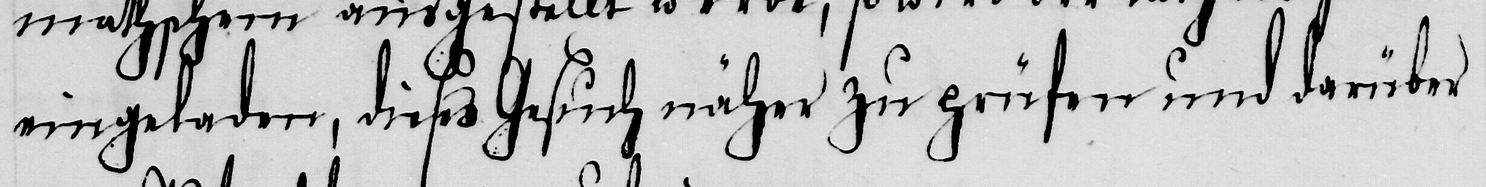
eingeladen, dieses Gesuch näher zu prüfen und darüber
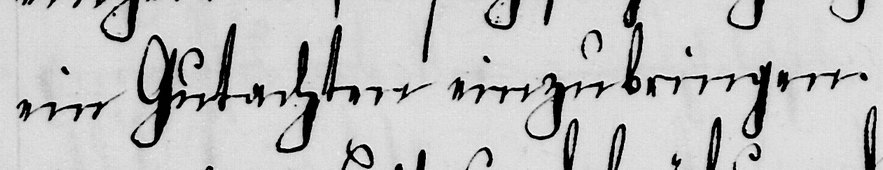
ein Gutachten einzubringen.
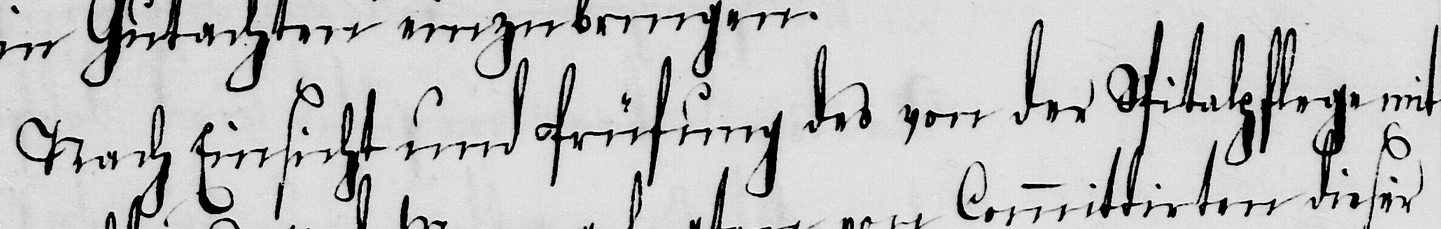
Nach Einsicht und Prüfung des von der Spitalpflege m¬
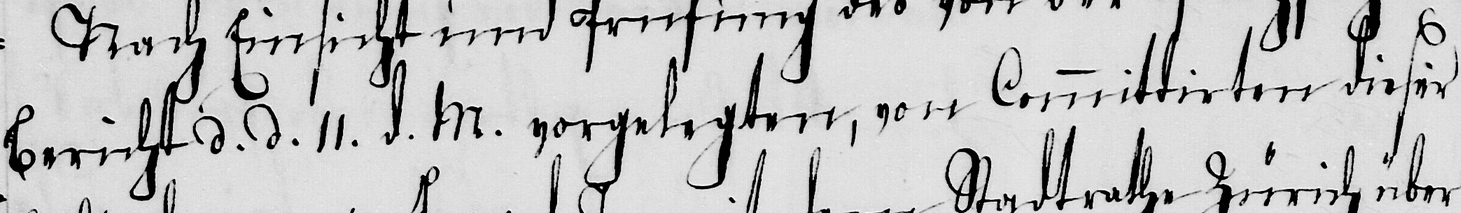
Bericht d. d. 11. d. M. vorgelegten, von Committirten dieser
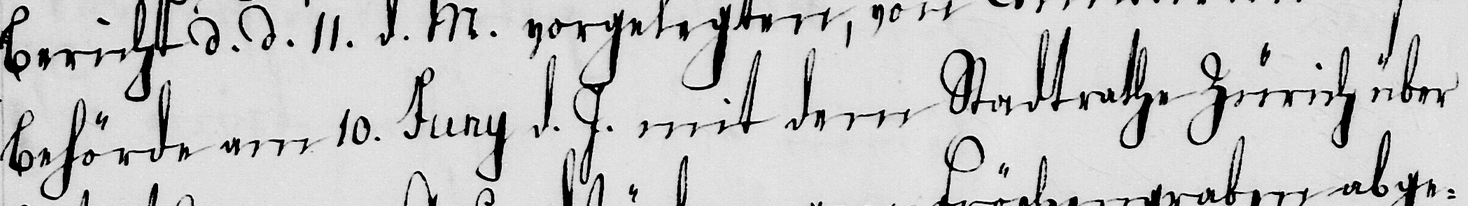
Behörde am 10. Juny d. J. mit dem Stadtrathe Zürich über
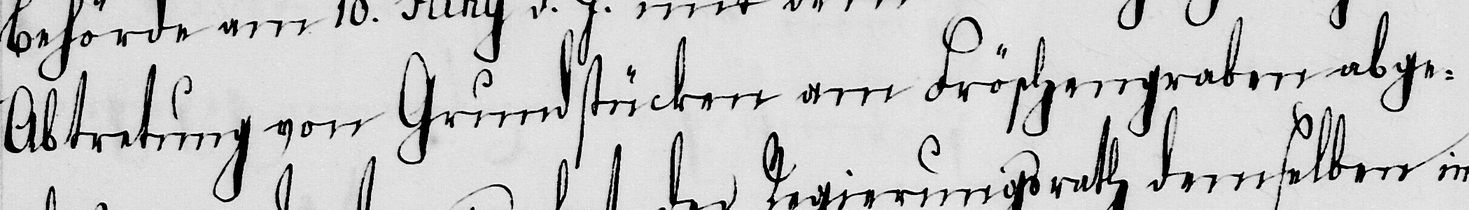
Abtretung von Grundstücken am Fröschengraben abge¬
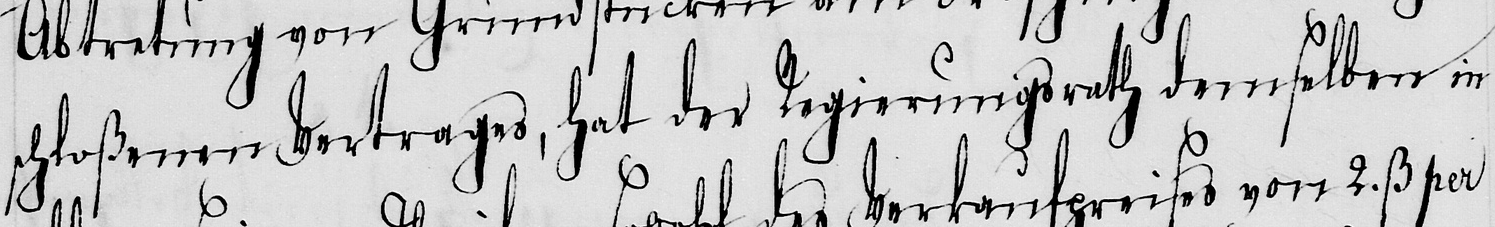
schloßenen Vertrages, hat der Regierungsrath demselben in
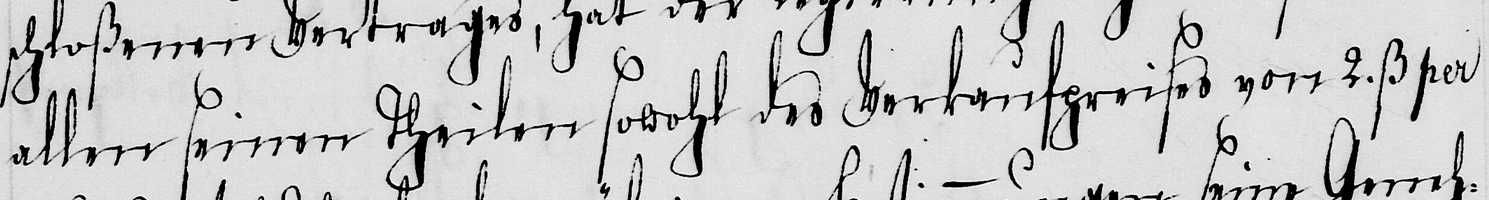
allen seinen Theilen sowohl des Verkaufspreises von 2. ß. per
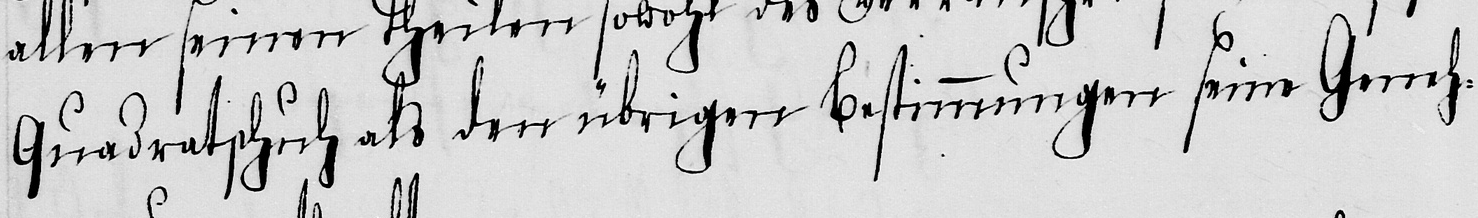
Quadratschuh als den übrigen Bestimmungen seine Geneh¬
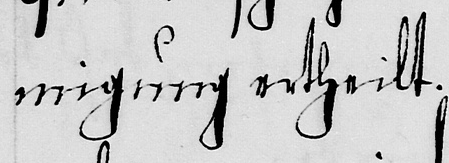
migung ertheilt.
